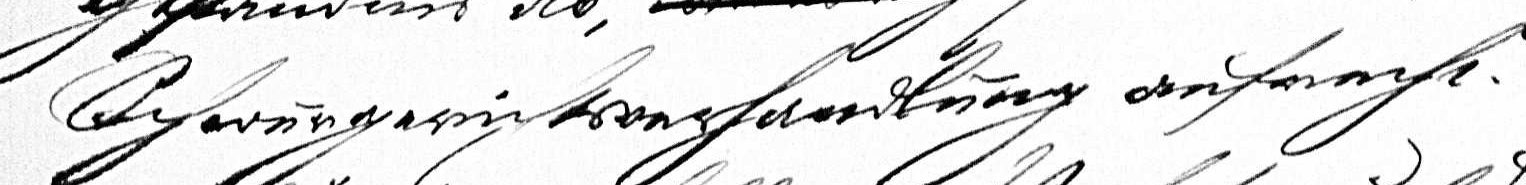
Schwurgerichtsverhandlung aufrecht.
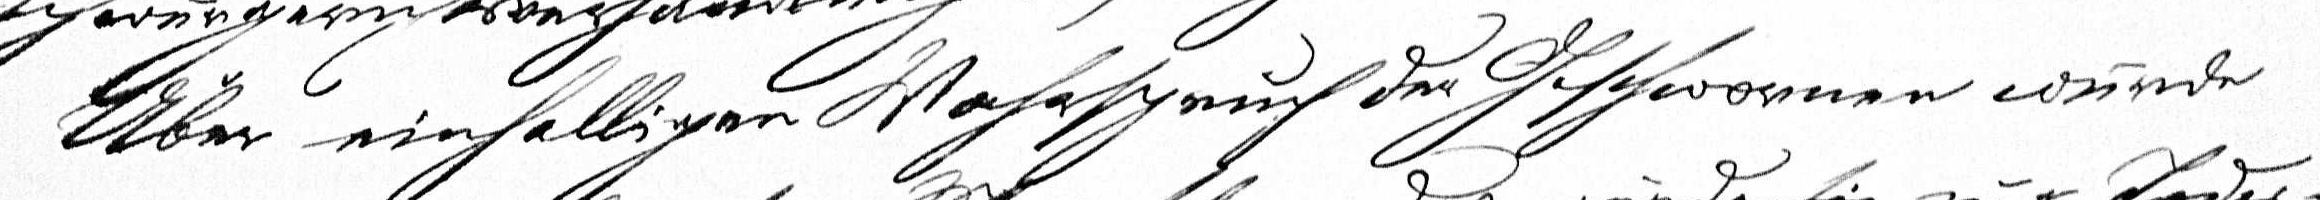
Über einhelligen Wahrspruch der Geschworenen wurde
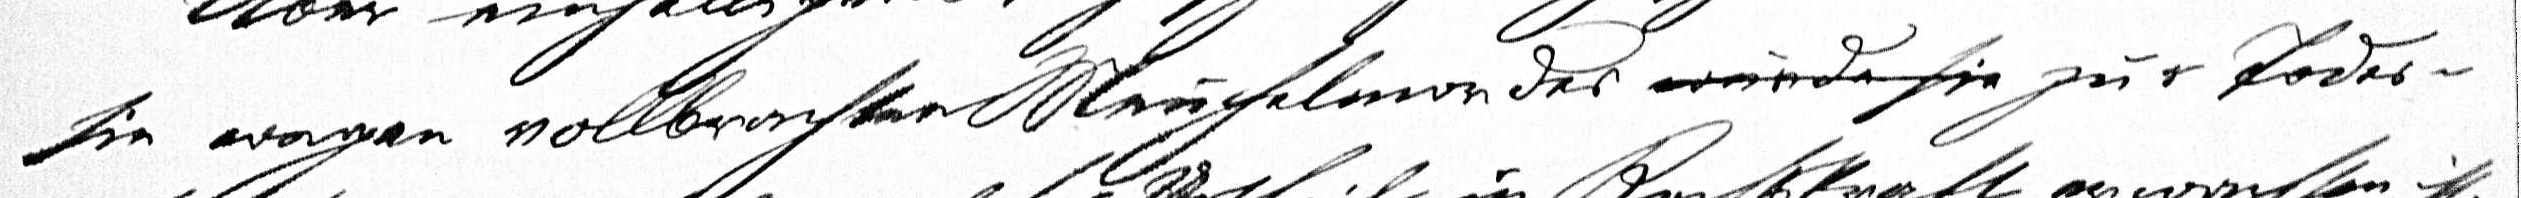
sie wegen vollbrachten Meuchelmordes zur Todes¬
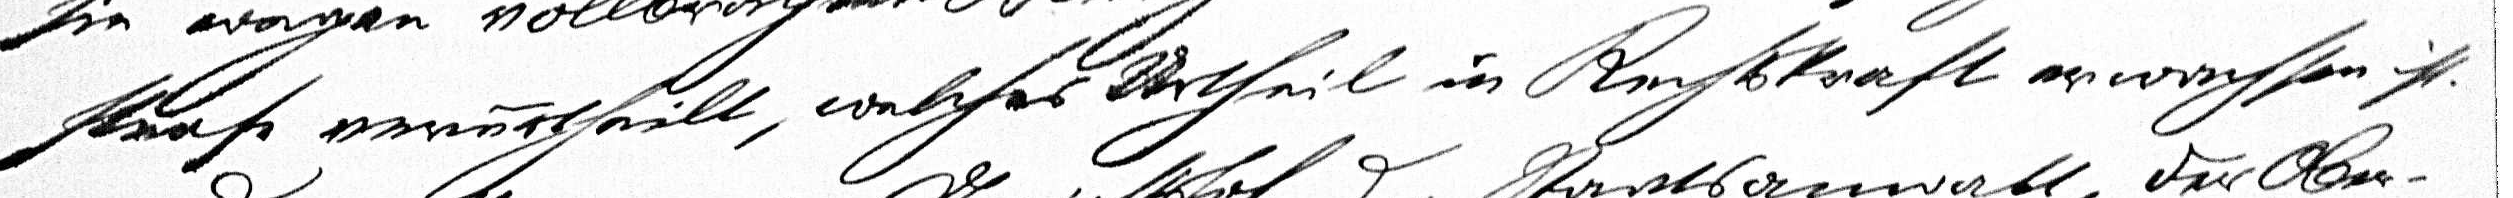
strafe verurtheilt, welches Urtheil in Rechtskraft erwachsen ist.
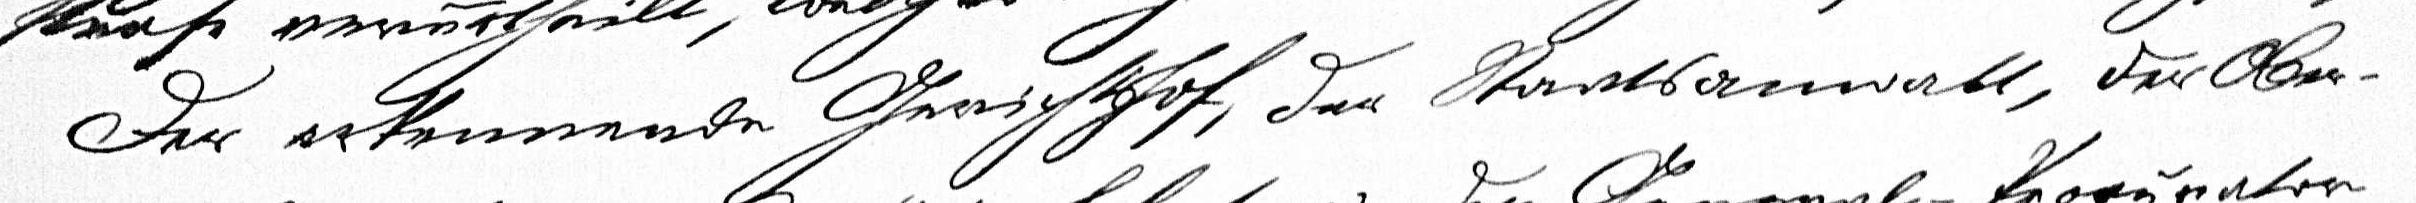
Der erkennende Gerichtshof, der Staatsanwalt, der Ober¬
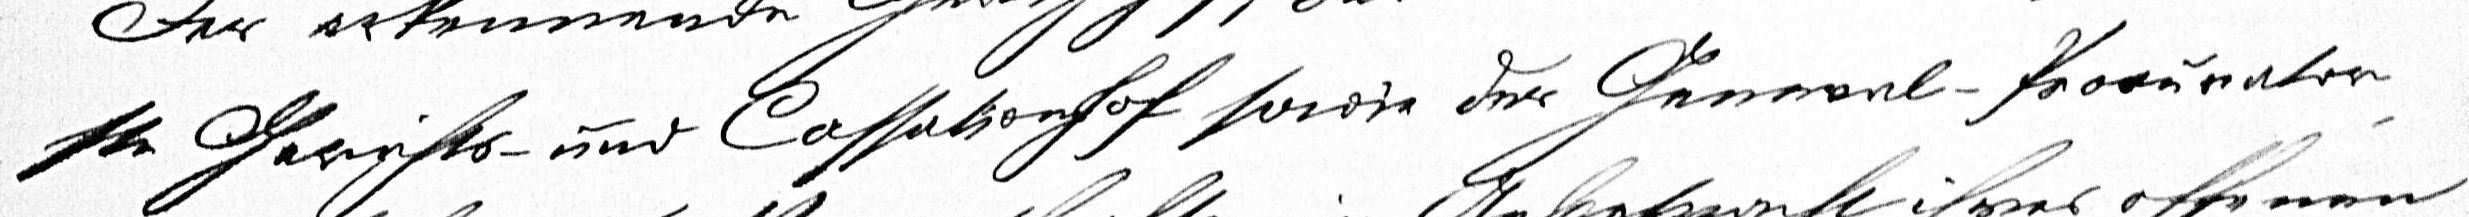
ste Gerichts- und Cassationshof sowie der General-Procuratur
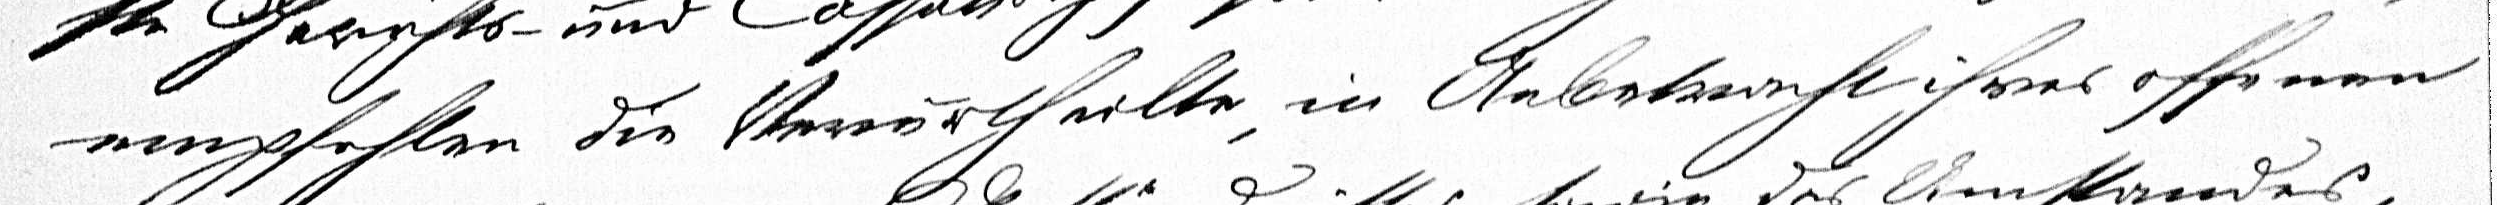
empfehlen die Verurtheilte, in Anbetracht ihres offenen
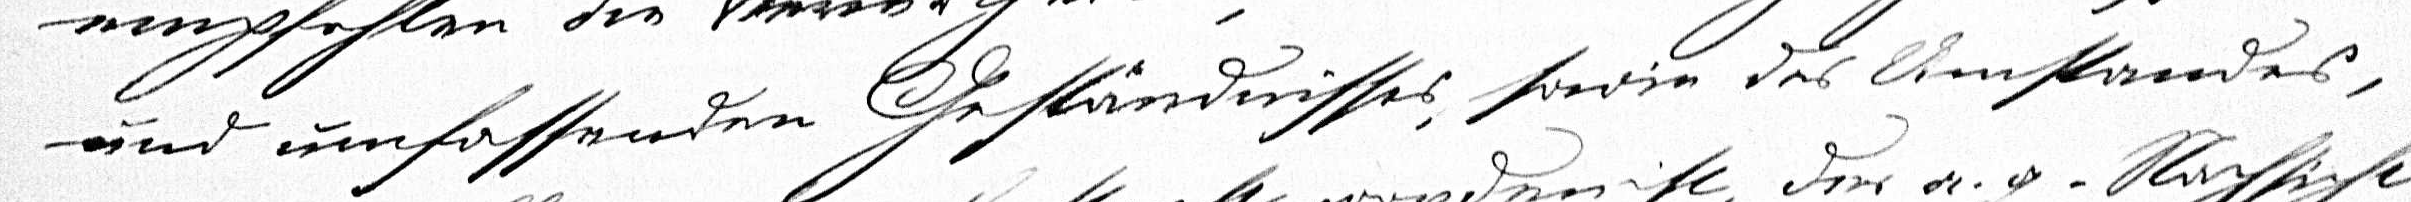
und umfassenden Geständnisses, sowie des Umstandes,
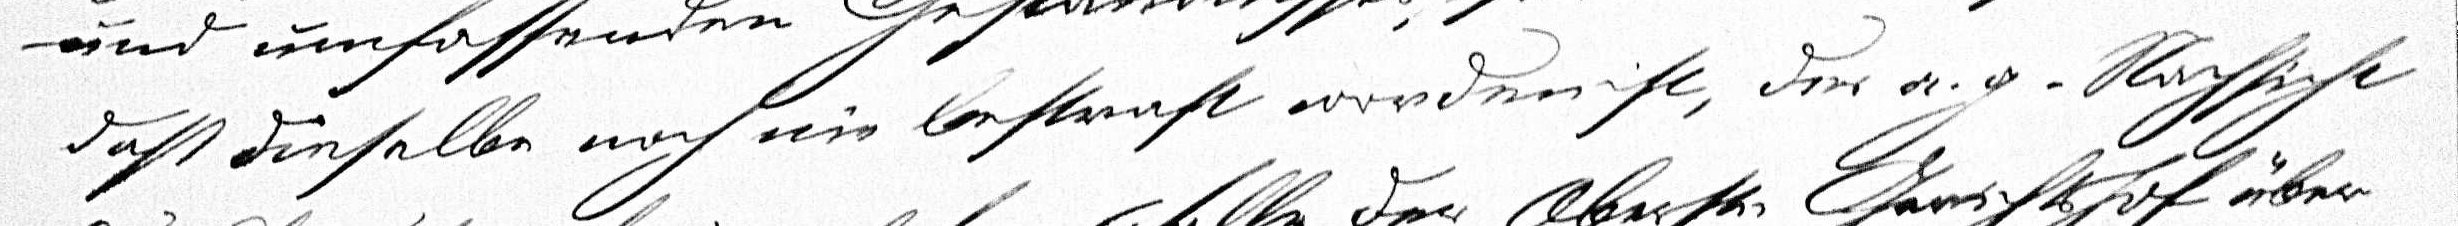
daß dieselbe noch nie bestraft worden ist, der a.g. Nachsicht
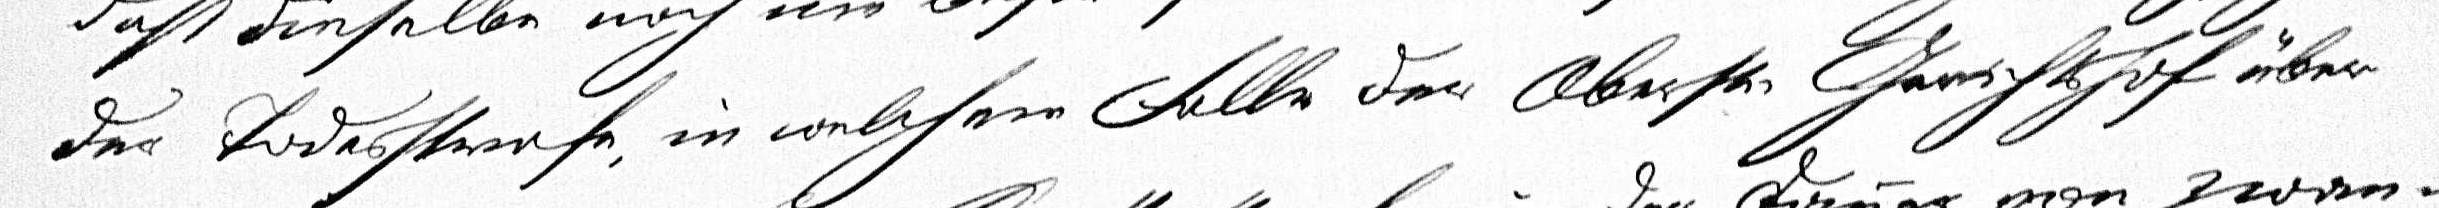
der Todesstrafe, in welchem Falle der Oberste Gerichtshof über
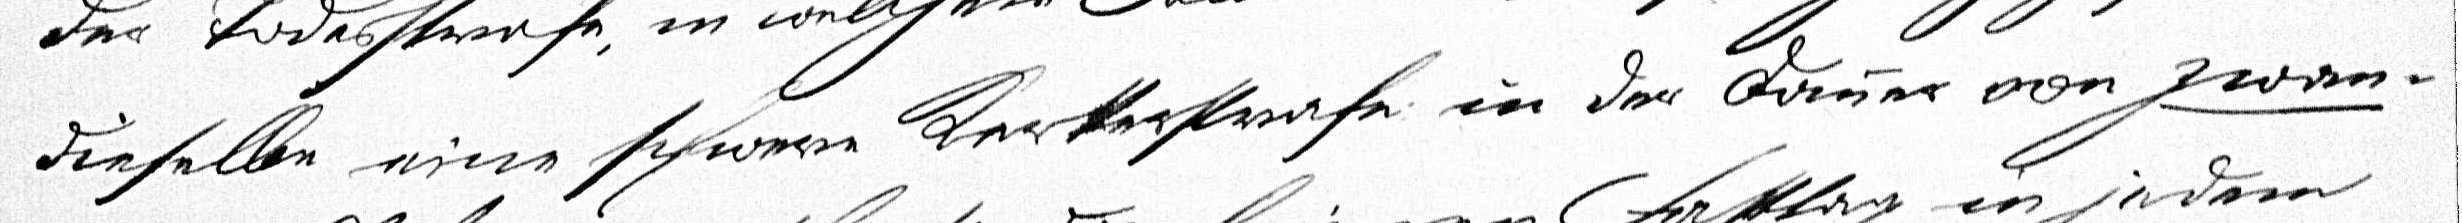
dieselbe eine schwere Kerkerstrafe in der Dauer von zwan¬
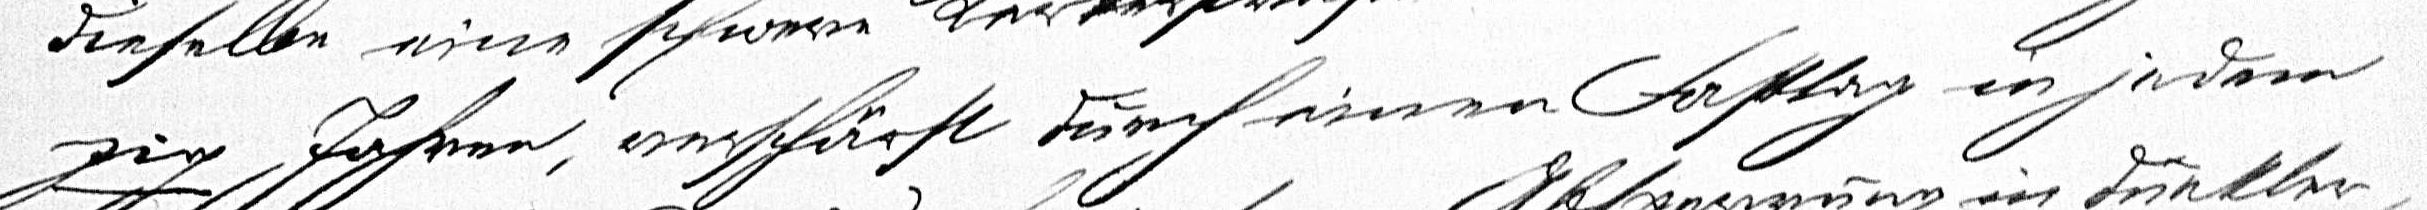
zig Jahren, verschärft durch einen Fasttag in jedem
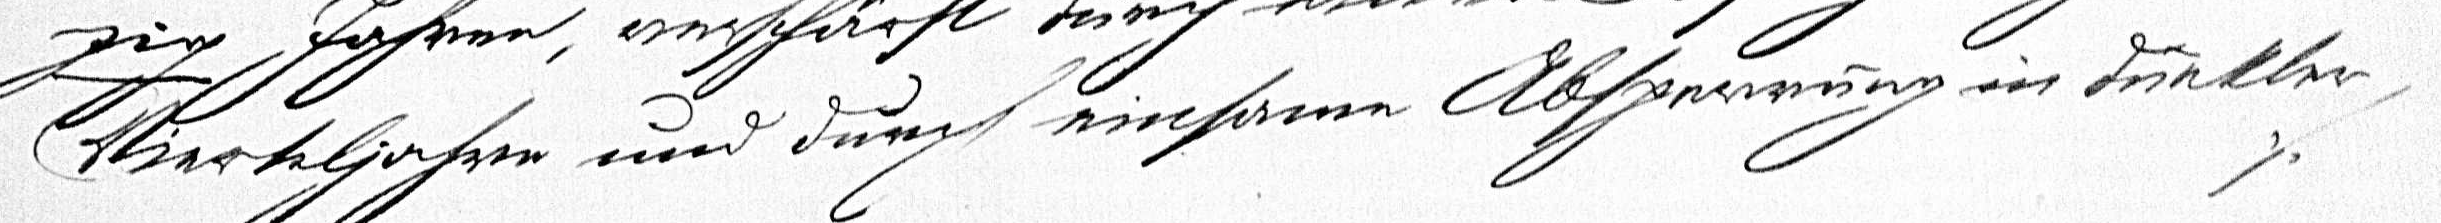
Vierteljahren und durch einsame Absperrung in dunkler
